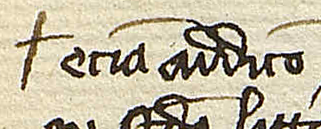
ecia* addito*
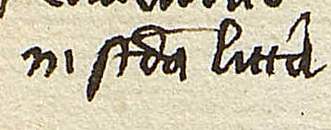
in ſc*da litt*a
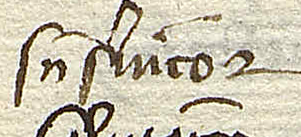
ſn* ſ*uico* @
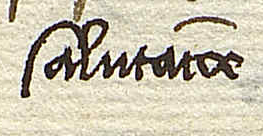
ſalutacoe*
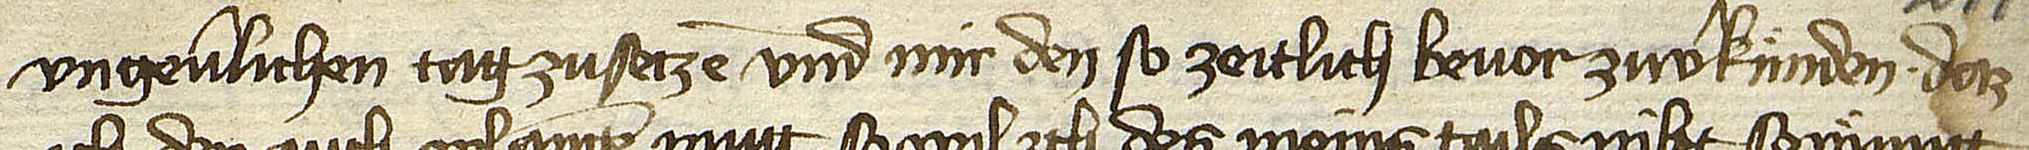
vngeu*lichen tag ʒuſecʒe* vnd mir den ſo ʒeitlich beuor ʒuv*künden . daʒ
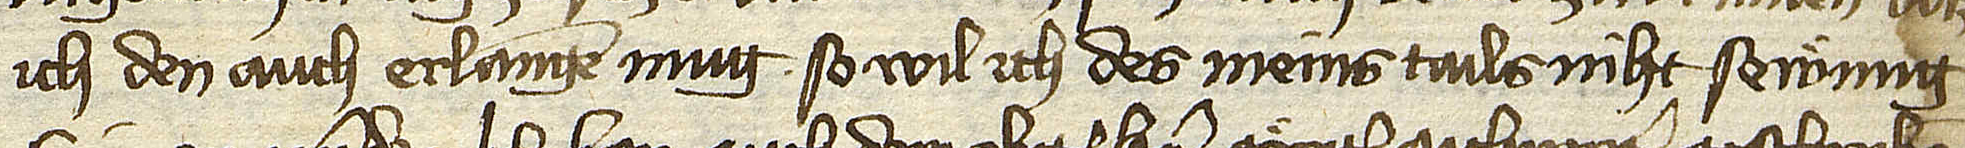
ich den auch erlange* mug . ſo wil ich des meins tails niht ſewmig
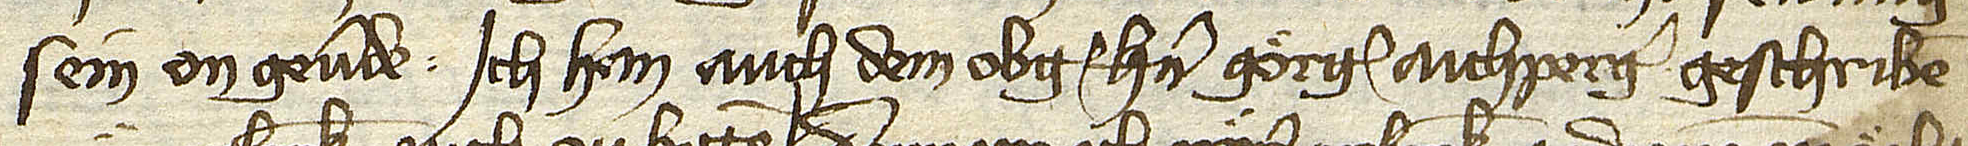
ſein on geu*de : Ich han auch dem obg* h*n görg* aichperg* geſchribe*
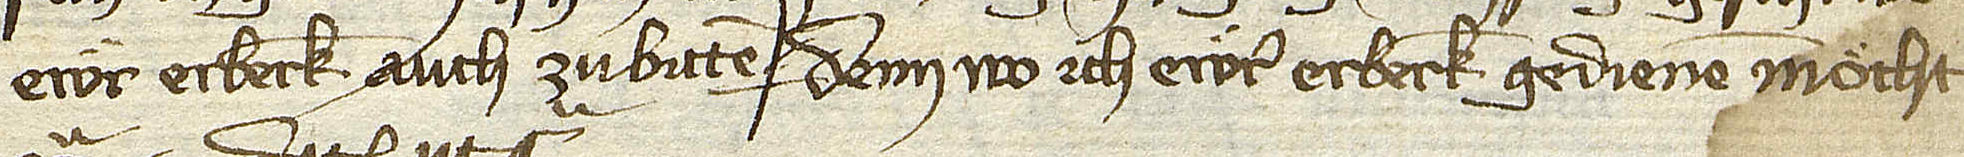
ewr erberk* . auch ʒu bitte* Denn wo ich ewr* erberk* gediene* möcht
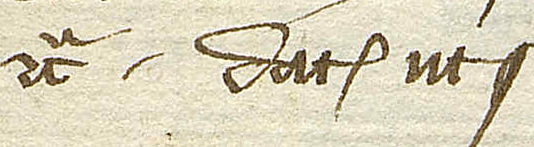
ec* / Dat* ut ſ*
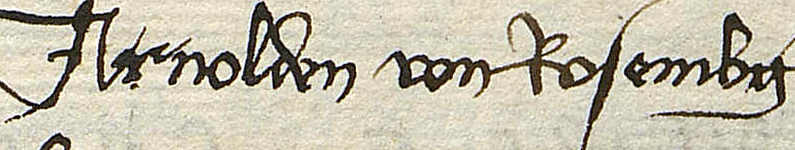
Arnolden von Roſemb*g
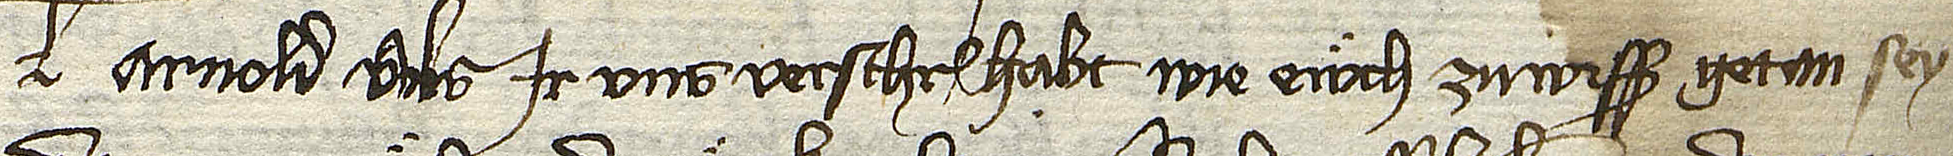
L* arnold als Ir vns verſchr* habt wie ewch ʒuwiſſ* getan ſey
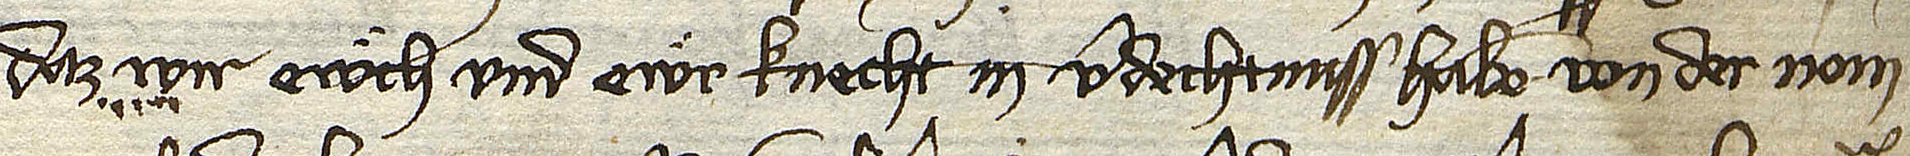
daʒ wir ewch vnd ewr knecht in v*dechtnuſſ habe* von der nom
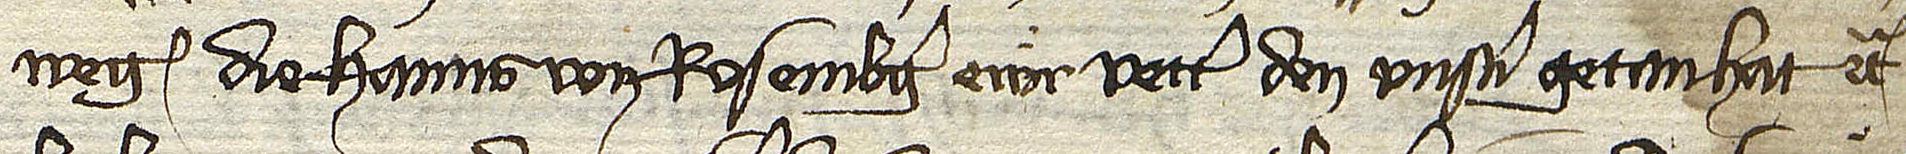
weg* die hanns von Roſemb*g ewr vett* den vnſ*n getan hat ec*
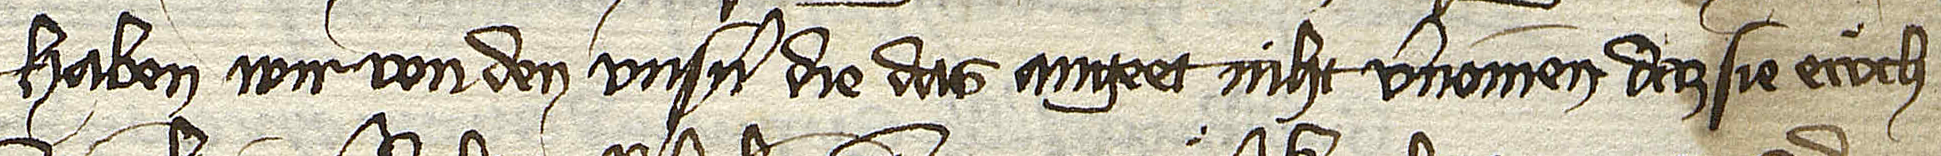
haben wir von den vnſ*n die das angeet niht v*nomen* daʒ ſie ewch
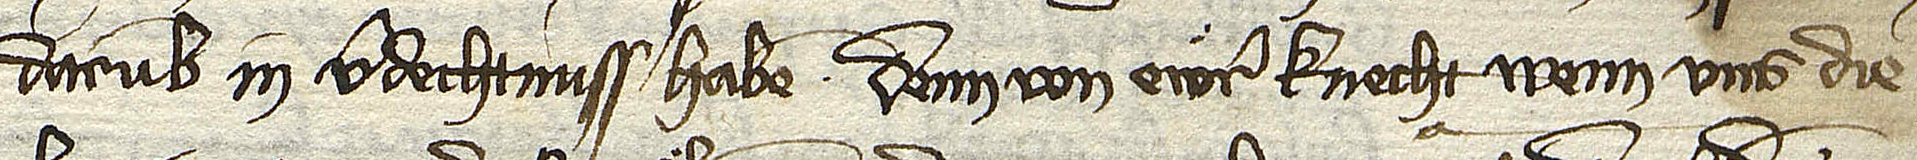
daru*b in v*dechtnuſſ habe* . Denn wo ew*r knecht wenn vns die
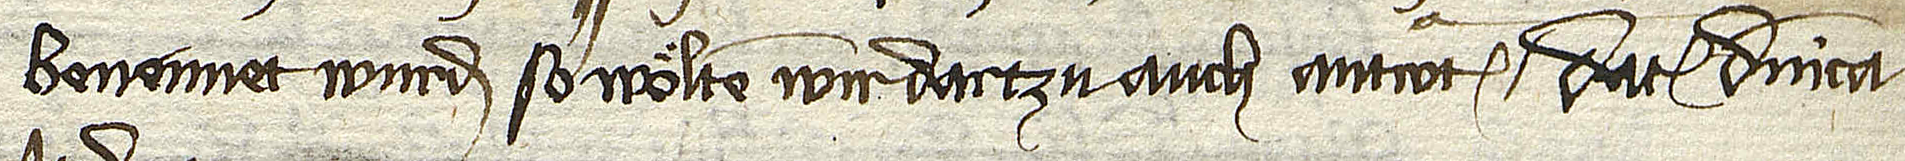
benennet wurd* ſo wölte* wir darcʒu auch antw*t* / Dat* dnica*
